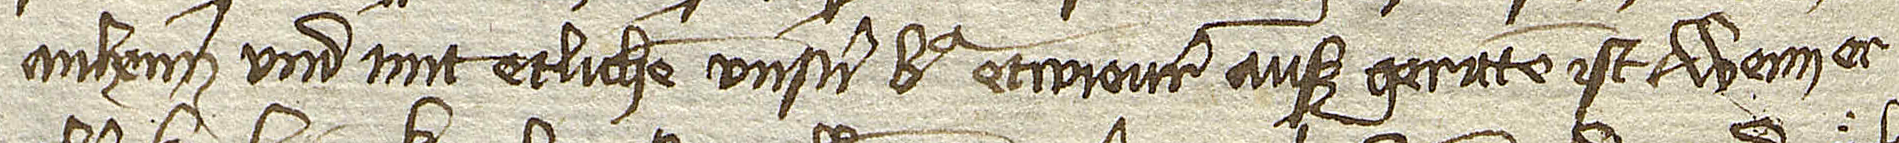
anheim vnd mit etliche* vnſn* b* etwieur* auſʒ geritte* iſt / Wenn er
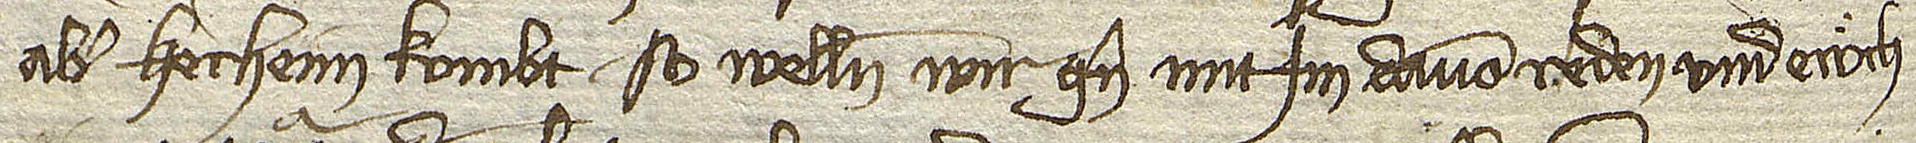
ab* herheim kombt / ſo welln* wir g*n mit Im dauo* reden vnd eẅch
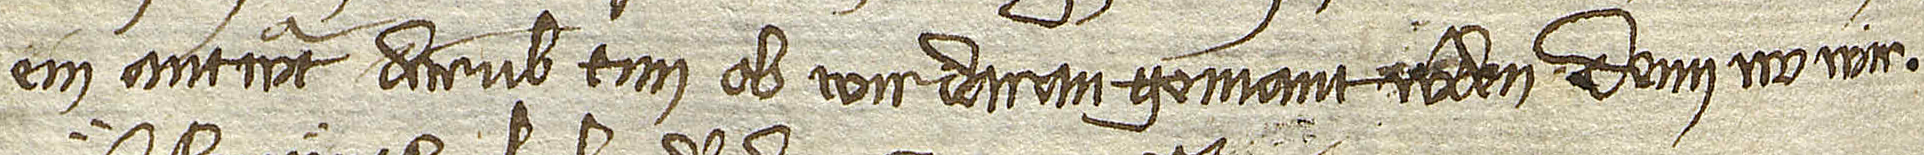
ein antw*t / Darub* tun ob wir daran gemant w*den Denn wo wir
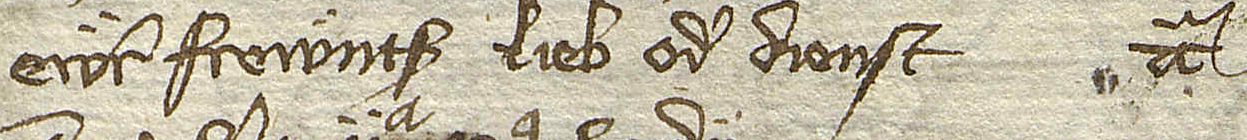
eẅr* freẅntſ* lieb od* dienſt ec*
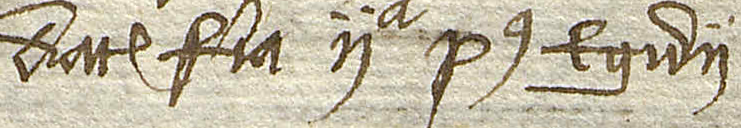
Dat* fi*a ii* p* Egidii
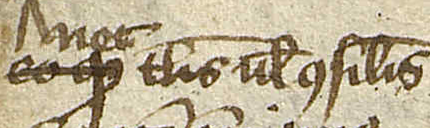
eo q* c*lis u*l *ſilis
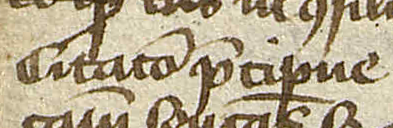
Citata* p*cipue
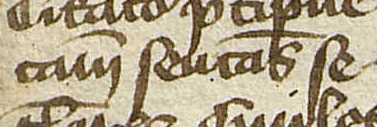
ca*m ſeu ca*s ſe-
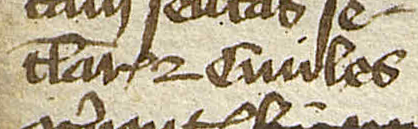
c*lar* @ Ciuiles
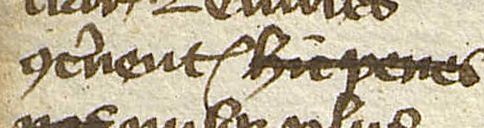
*c*nent* hic penes
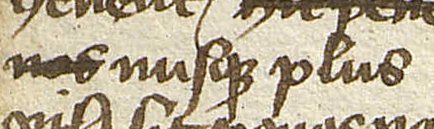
nos nuſq* plus
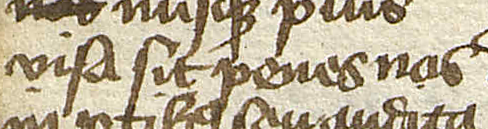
viſa ſit penes nos
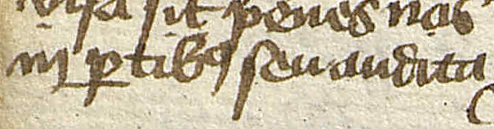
in p*tib* ſeu audita
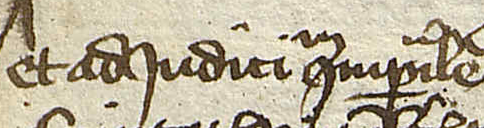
et ad Iudici*m Imp*i*le
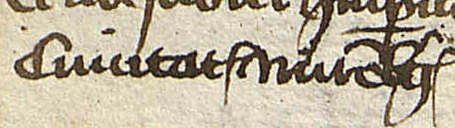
Ciuitat* Nure*b*g*
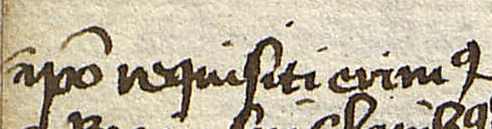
ip*o requiſiti erim*
